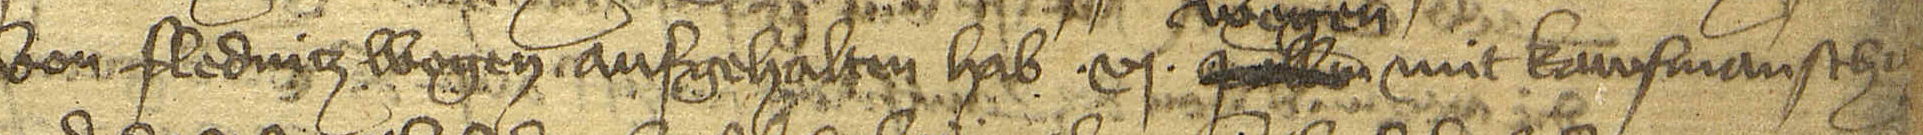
von flednicʒ wegen aufgehalten hab . vi . pellein mit kawfmanſch*
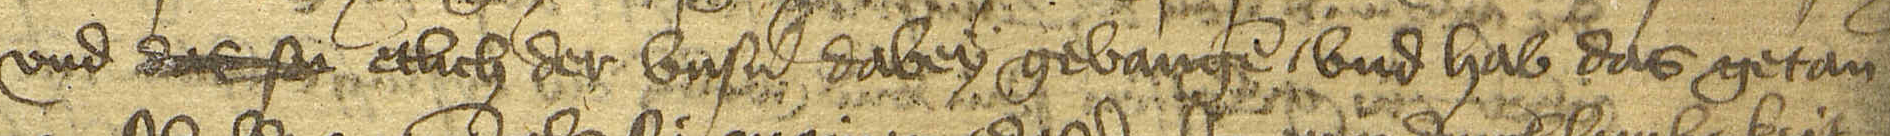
vnd das ſei etlich der vnſn* dabey gevange* / vnd hab das getan
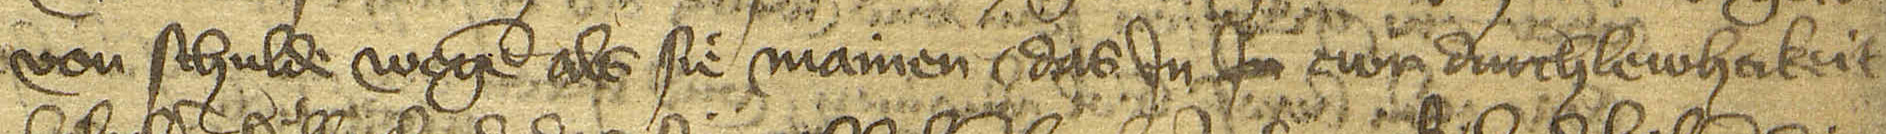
von ſchulde wege* als ſie mainen / das In In ewr duchlewhtikeit
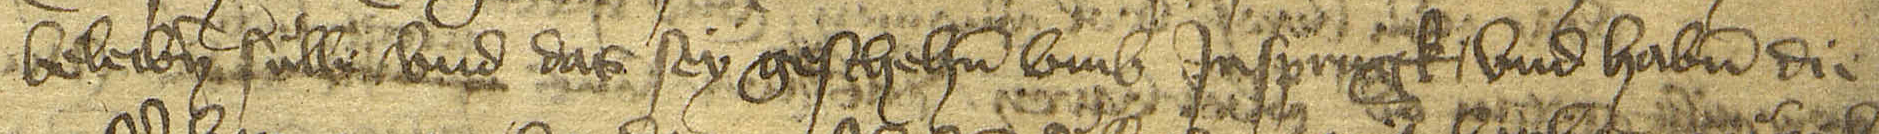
beleibn* ſülle / vnd das ſey geſchehn* vmb Inſprügk / vnd habn* die
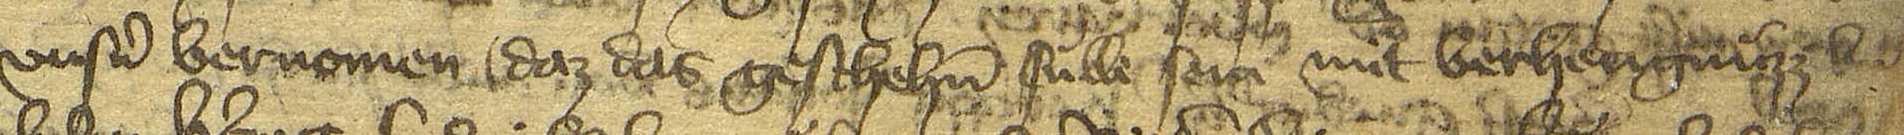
vnſn* vernomen / daʒ das geſchehn* ſülle ſein mit verhengnüʒʒ %
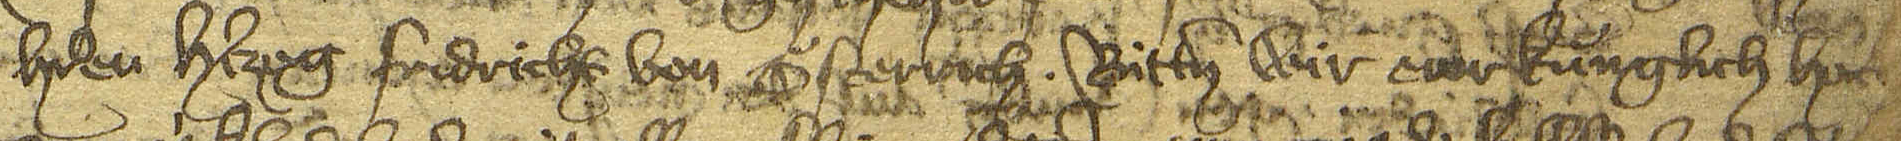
hr*n h*cʒog fridrichs von Öſterrich . Bittn* wir ewr künglich her
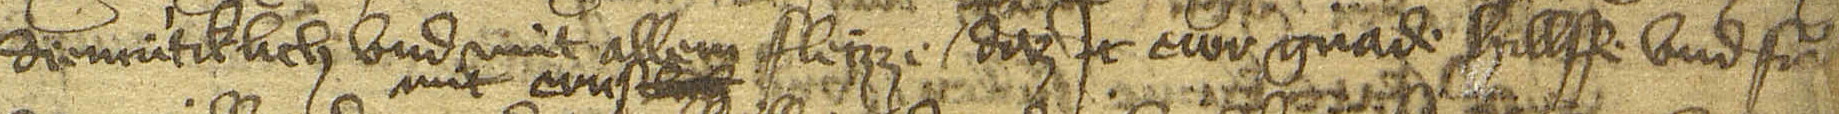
diemütiklich vnd mit allem fleiʒʒe / daʒ Ir ewr gnade hillffe vnd für
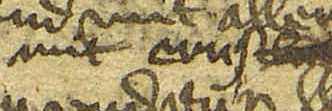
mit ernſtlich
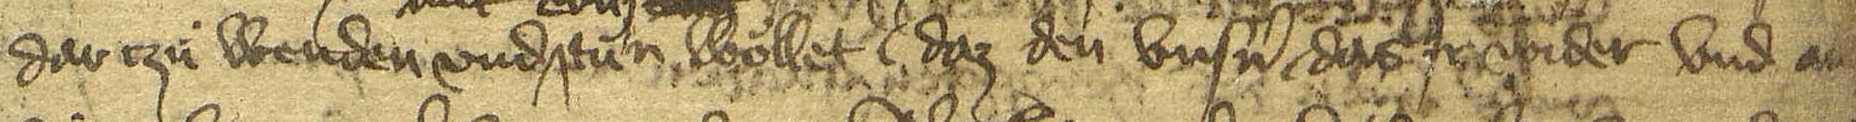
dar cʒü wenden vnd tün wöllet / daʒ den vnſn* / das Ir wider vnd an
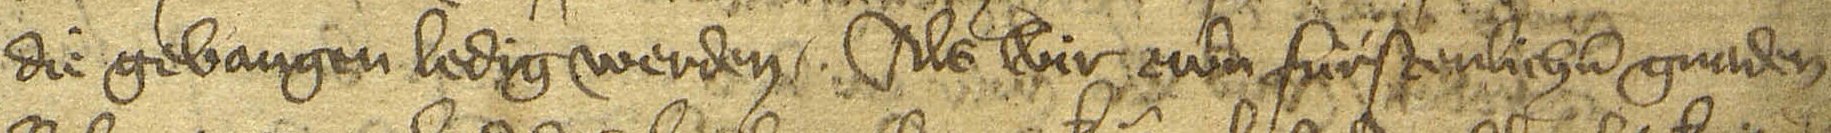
die gevangen ledig werden / . Als wir ew*n fürſtenlichn* gnaden
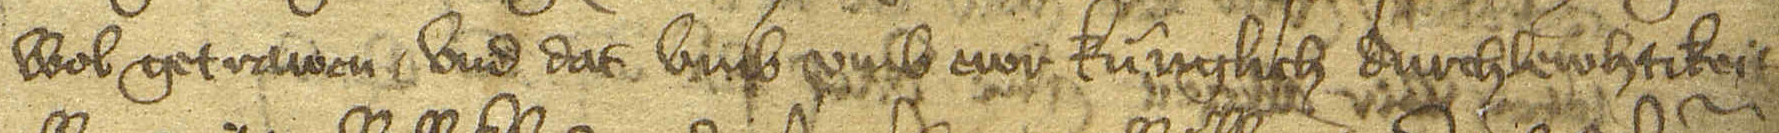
wol getrawen / vnd das vmb vmb ewr künglich durchlewhtikeit
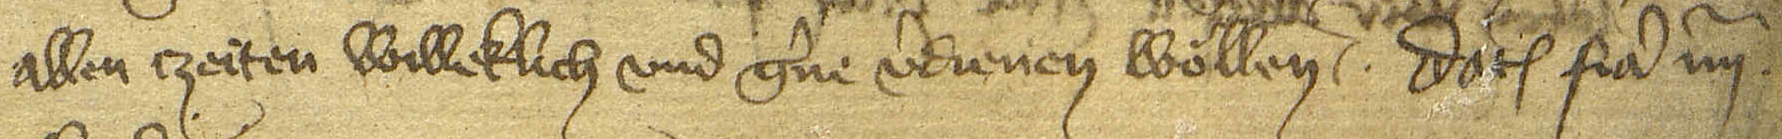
allen cʒeiten willeklich vnd g*ne v*dienen wöllen / . Dat* fia* iiii* %
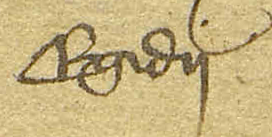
Egidii .
